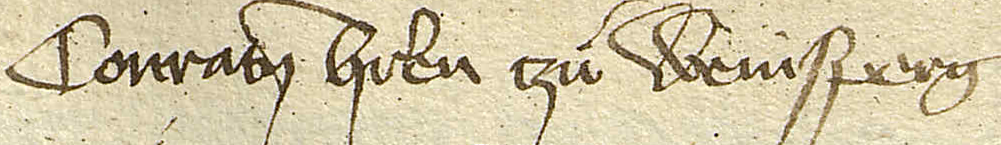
Conratn* hr*en cʒü Weinſperg
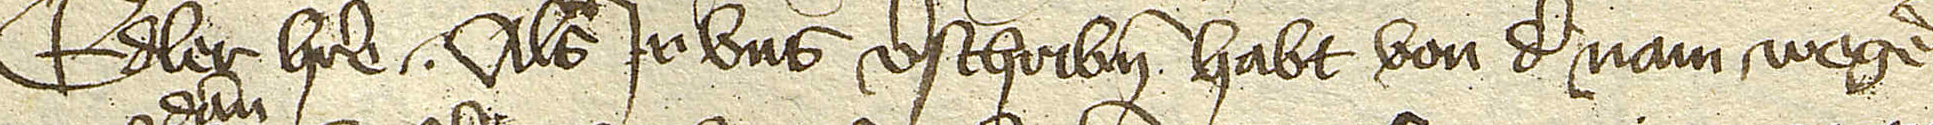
Edler hr*e /. Als Ir vns v*ſchribn* habt von d* nam wege*
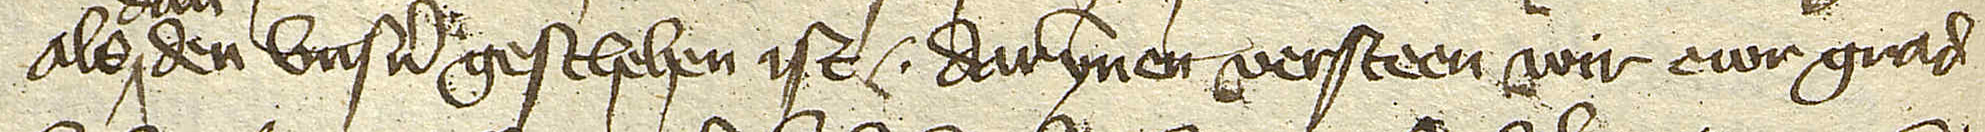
als den vnſn* geſchehen iſt / . dar*ynen verſteen wir ewr gnad
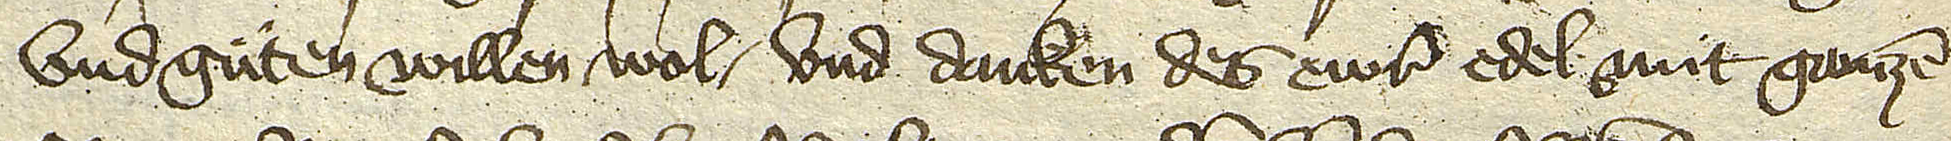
vnd güten willen wol / vnd danken des ewr* edel mit gancʒe*
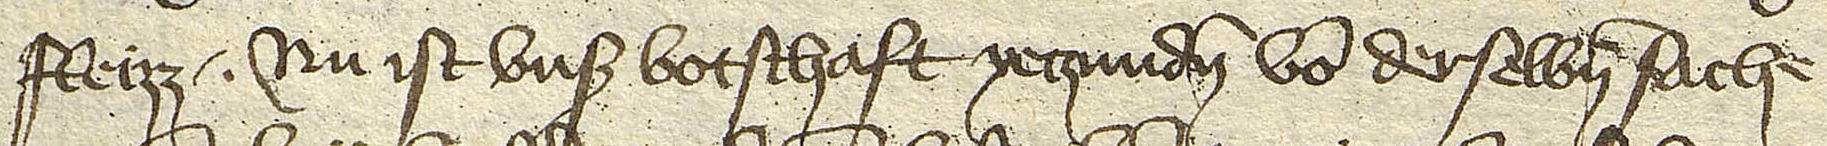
fleiʒʒ /. Nu iſt vnſ* botſchaft yecʒundn* vo* derſelbn* ſache
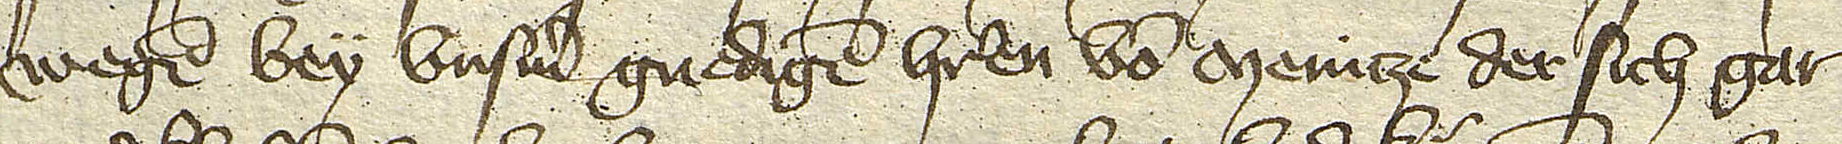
wege* bey vnſm* gnedige* hr*en vo* Meincʒe der ſich gar
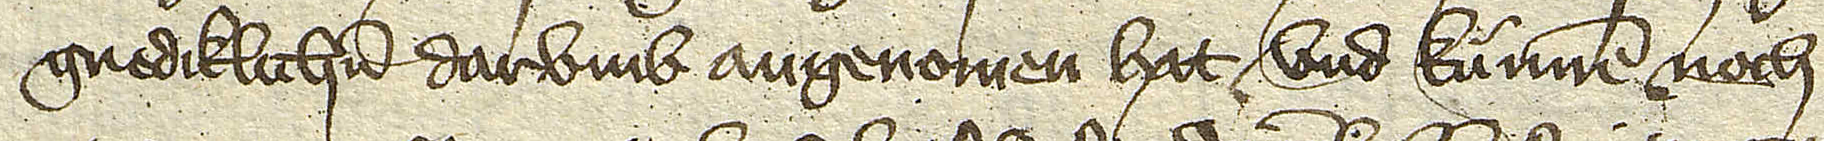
gnediklichn* darvmb angenomen hat / vnd künne* noch
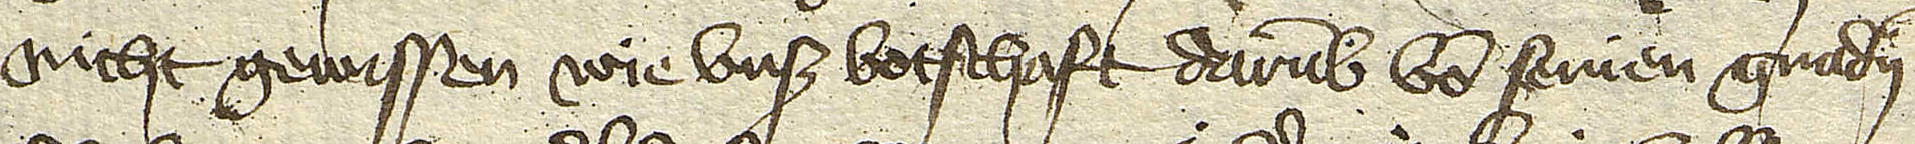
nicht gewiſſen wie vnſ* botſchaft darub* vo* ſeinen gnadn*
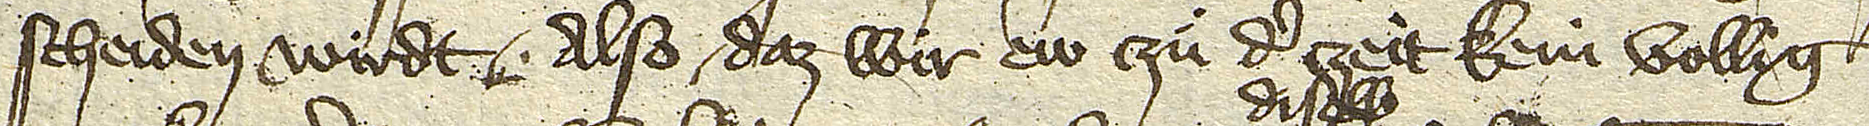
ſcheiden wirdt / . Alſo / daʒ wir ew cʒü d* cʒeit kein vollig
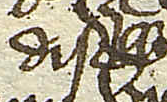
diſelb
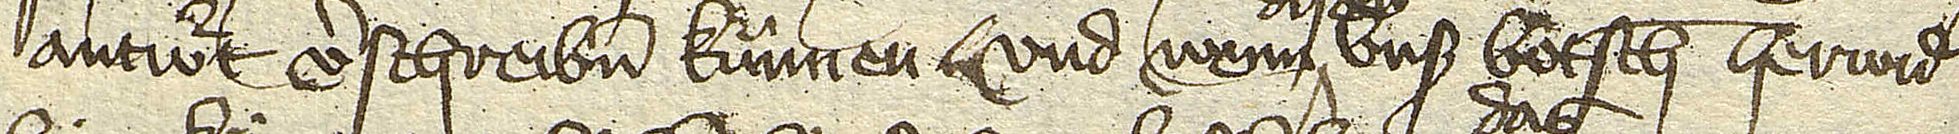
antw*t v*ſchreibn* künnen / vnd wenn vnſ* botſch* herwid*
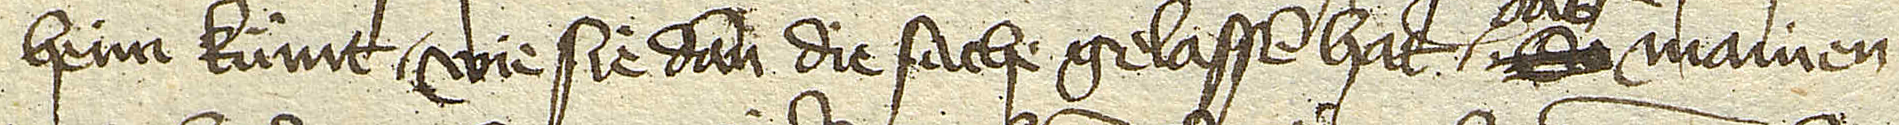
heim kümt / wie ſie dan* die ſache gelaſſe* hat / . So mainen
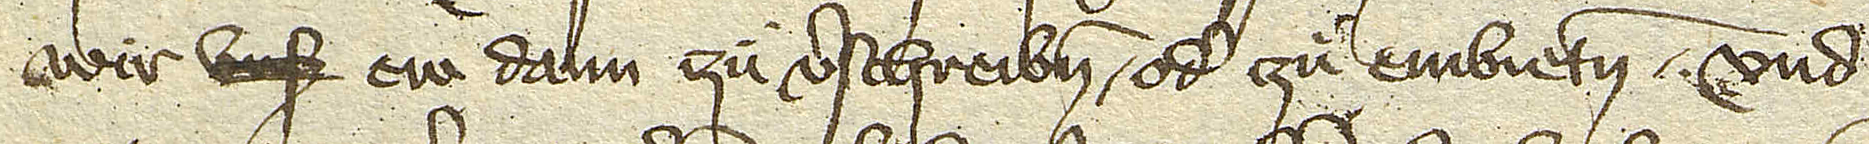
wir vnſ* ew dann cʒü v*ſchreibn* / od* cʒü embietn* / . vnd
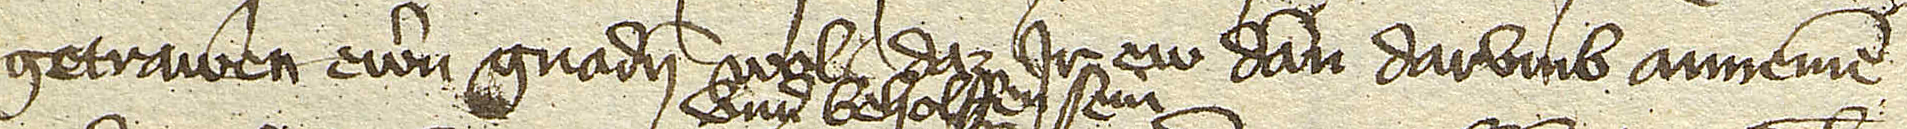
getrawen ewn* gnadn* wol / daʒ Ir ew dan* darvmb anneme*
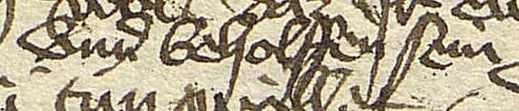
vnd beholffen ſein
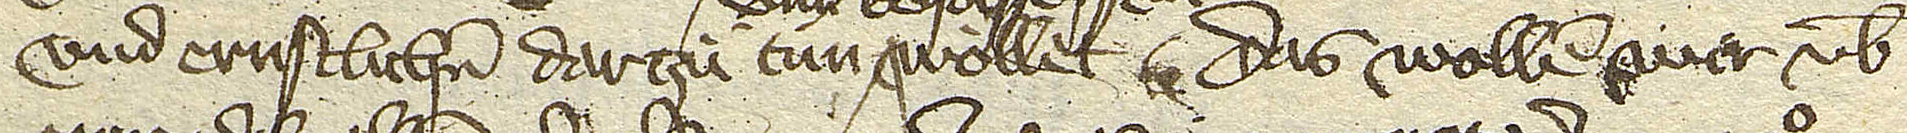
vnd ernſtlichn* darcʒü tün wöllet / Das wolle* wir vb*
